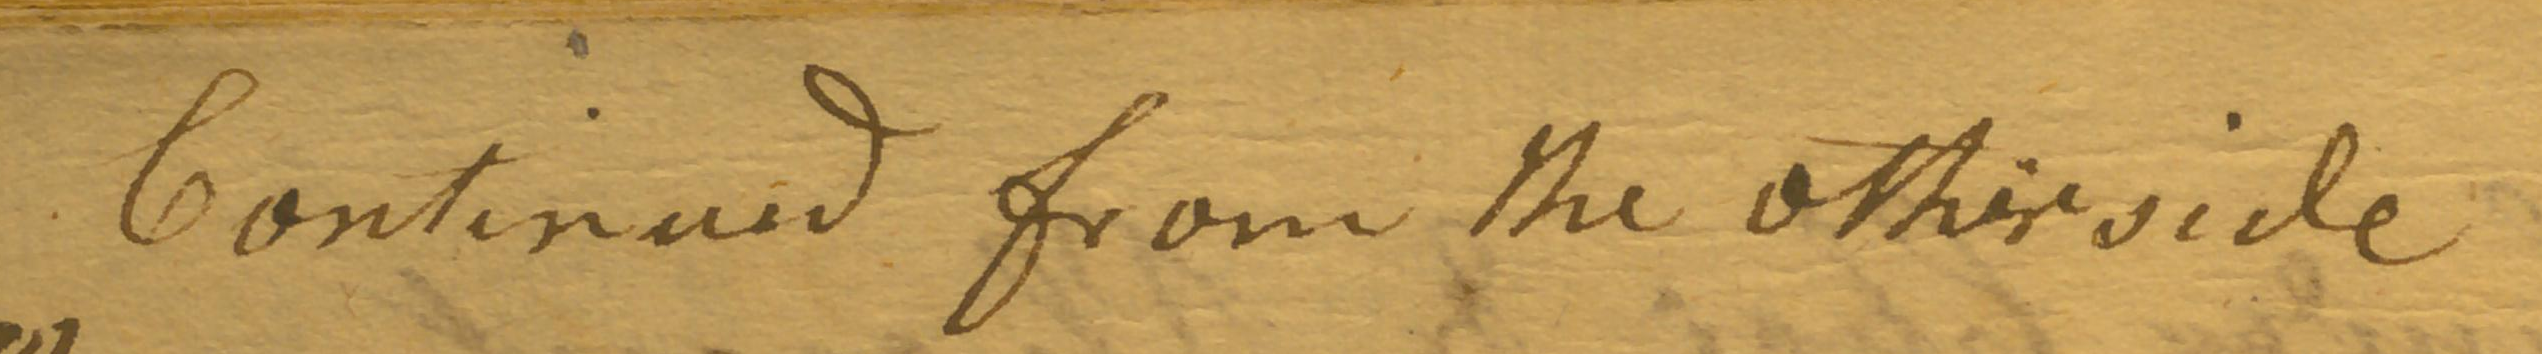Continued from the other side
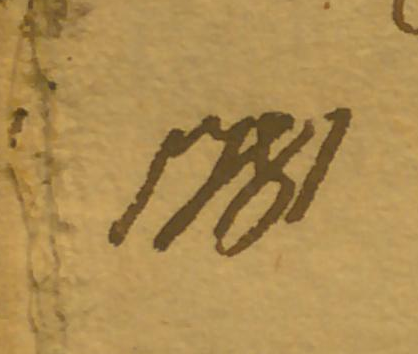1781
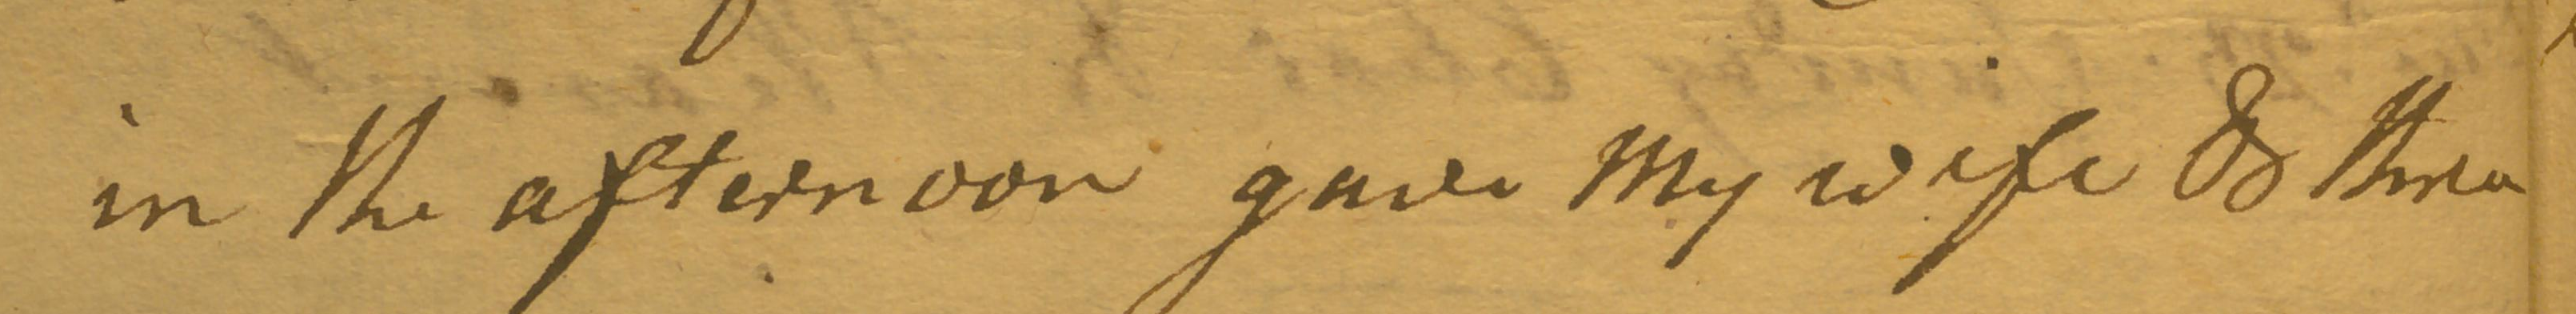in the afternoon gave My wife & three
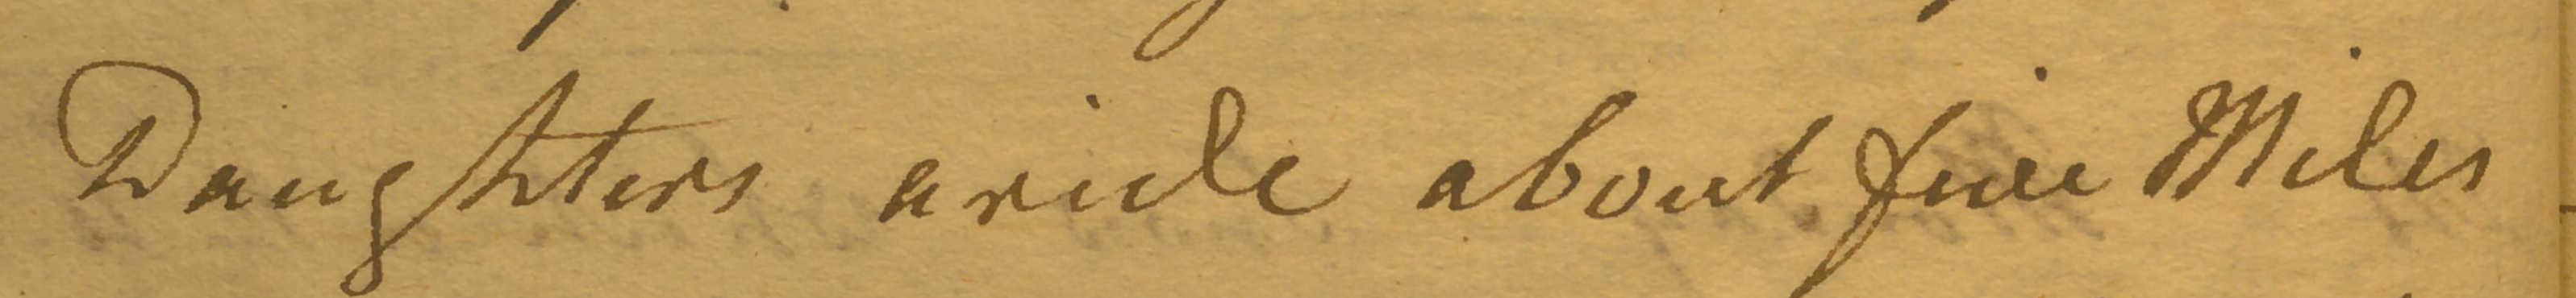Daughters a ride about five Miles
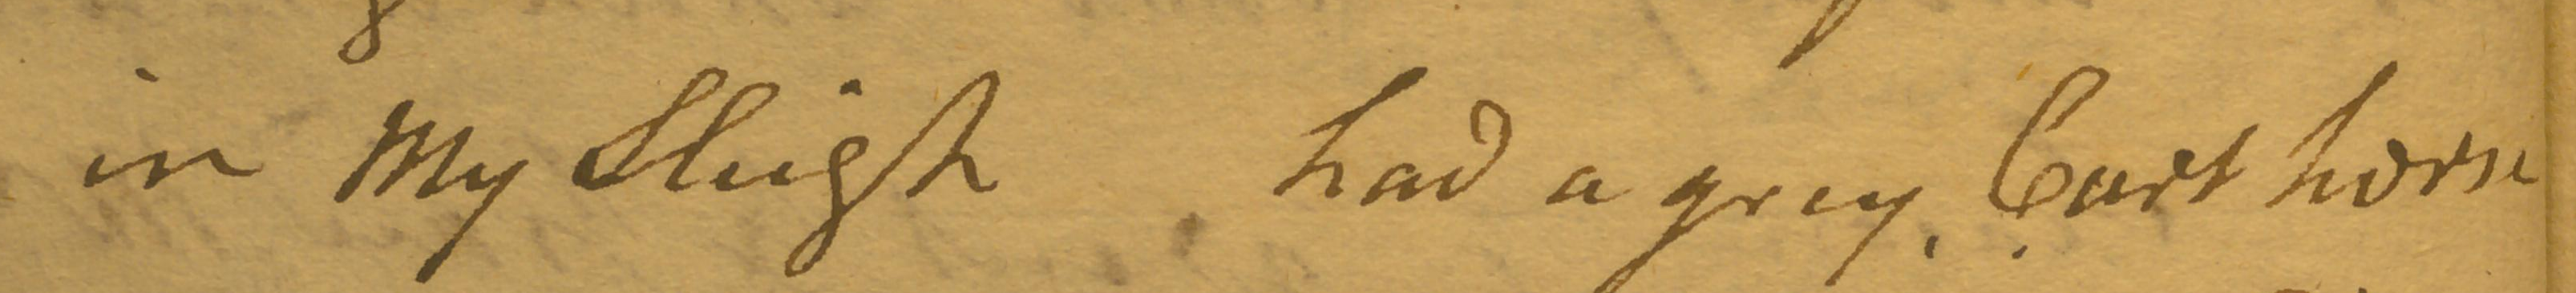in My Sleigh had a grey Cart horse
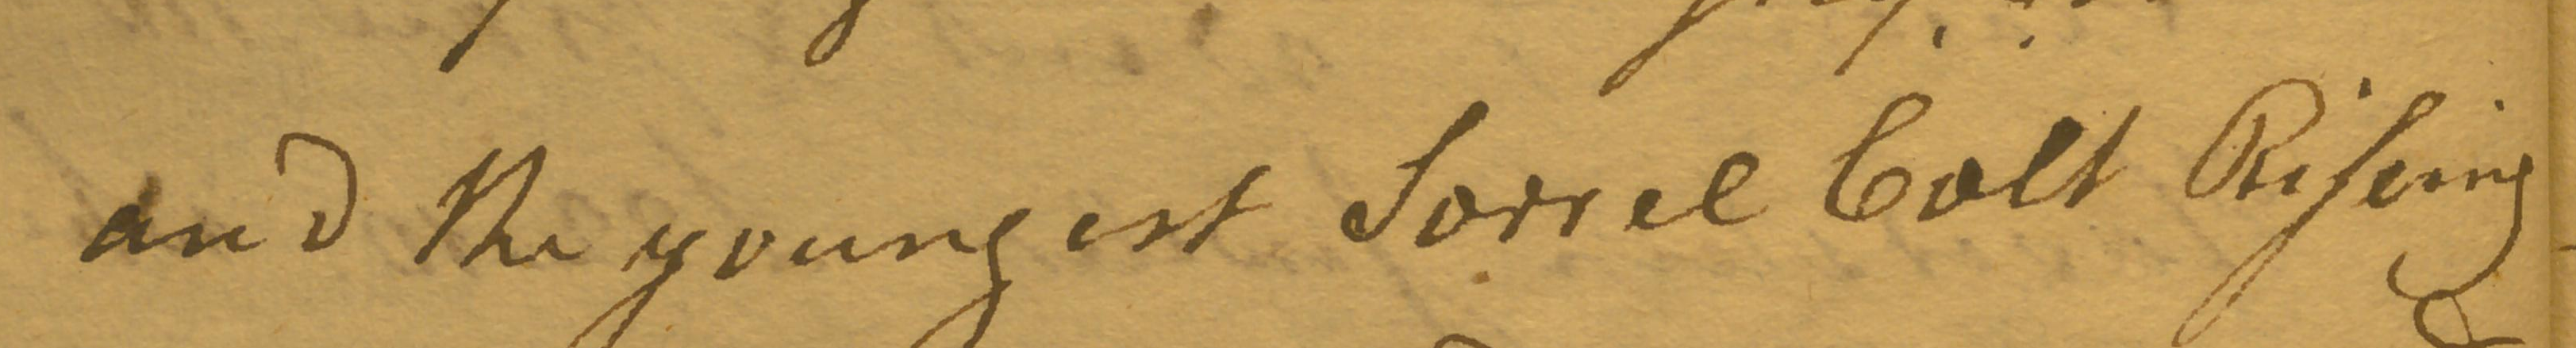and the youngest Sorrel Colt Riseing
